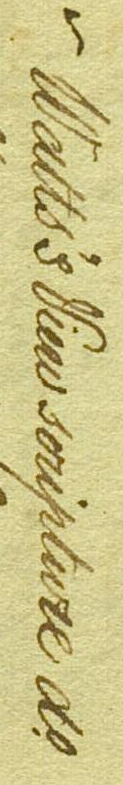- Watts's View scripture d^o.
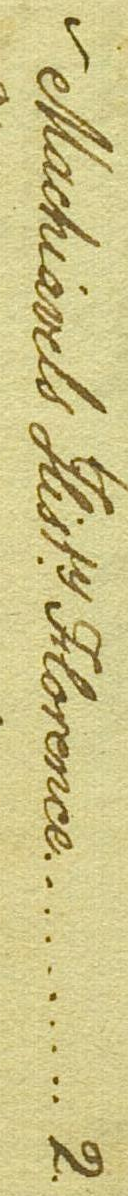- Machiavels Hist^y. Florence..........2.
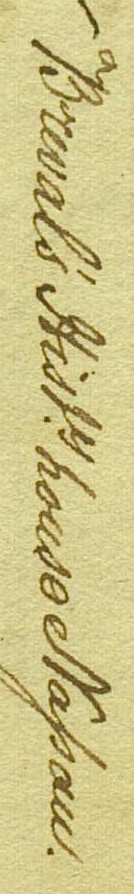- Breval's Hist^y. house Nassau.
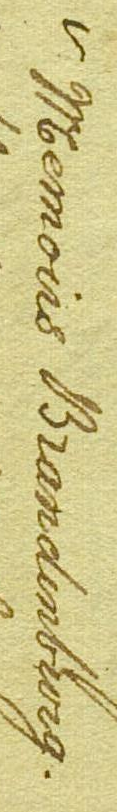- Memoirs Brandenburg.
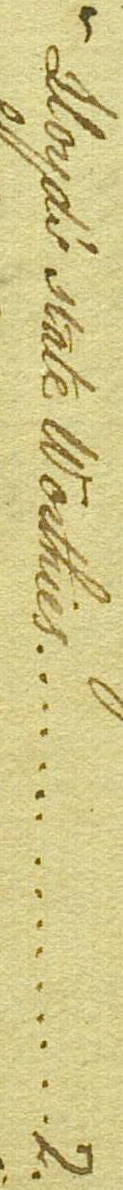- Lloyd's state Worthies................ 2.
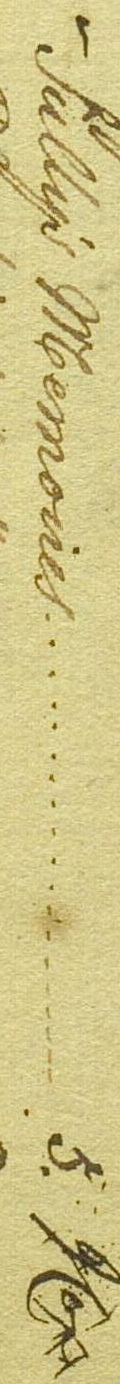- Sully's Memoirs.............. 5. [___]
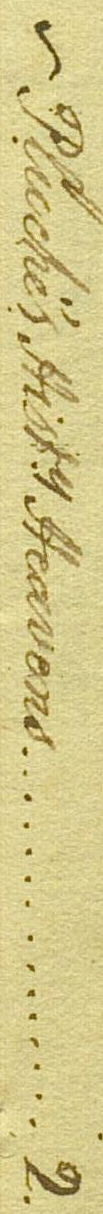- Plucke's Hist^y Heavens. .............. 2.
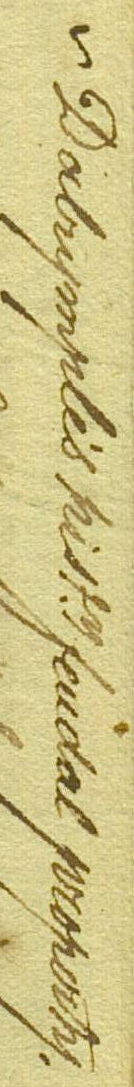- Dabrymple's hist^y feudal property.
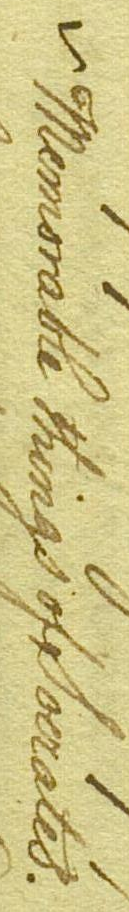- Memorable things of Socrates.
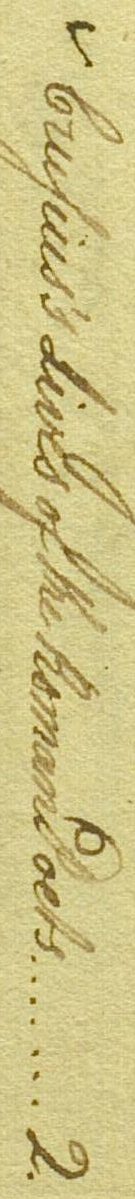- Crusius's Lives of the Roman Poets....... 2.
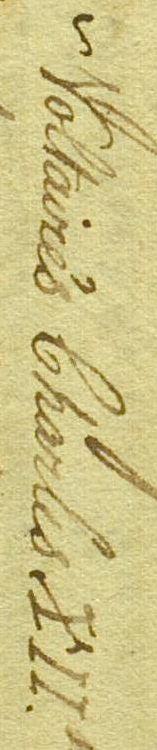- Voltaire's Charles XII.^th
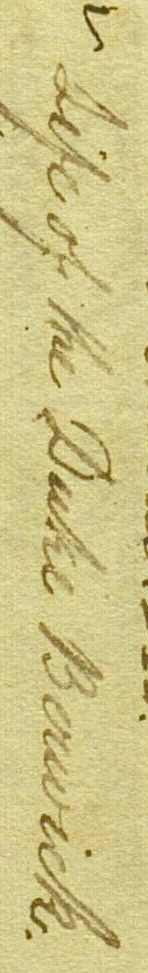- Life of the Duke Berwick.
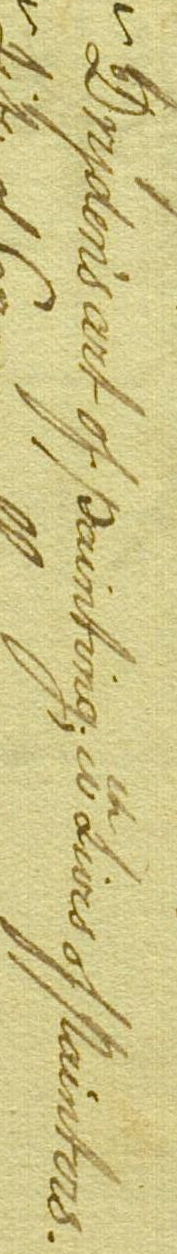- Dryden's art of Painting; w^th Lives of Paintors.
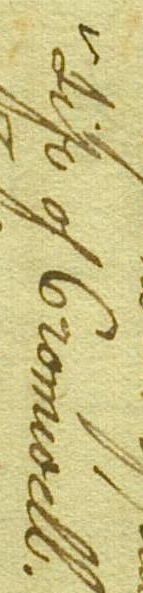- Life of Cromwell.
